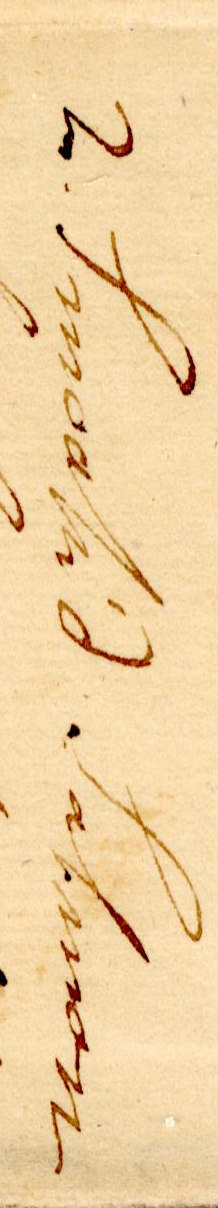2. Smoak'd Salmon
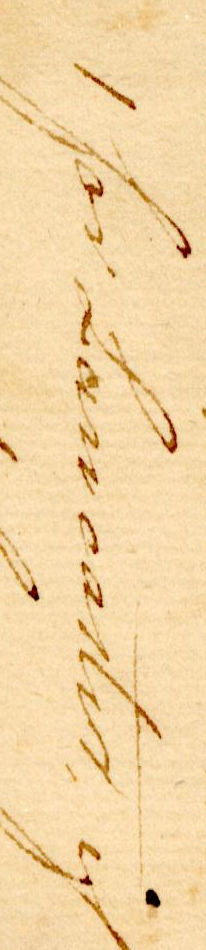1 for Lancaster if
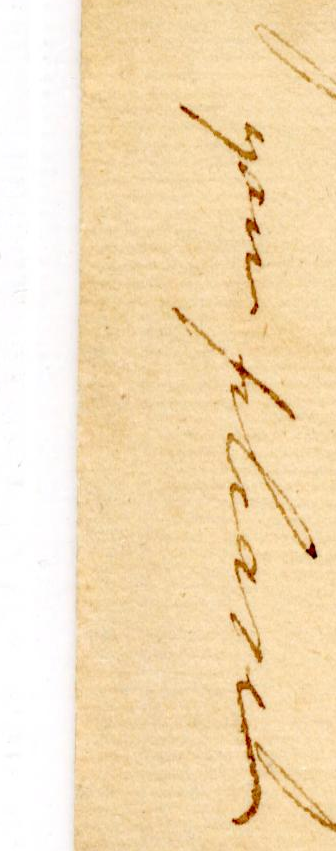you please
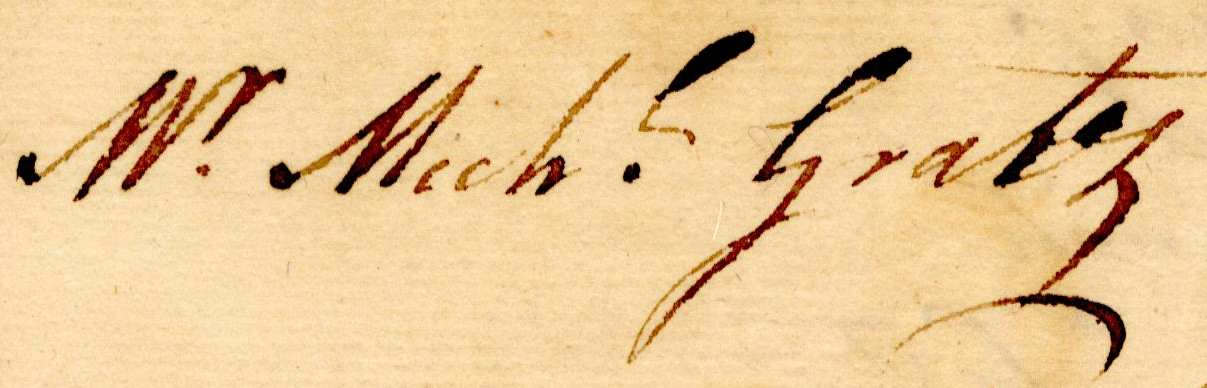M^r Mich^l Gratz
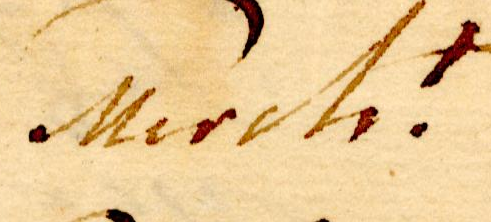Merch^t
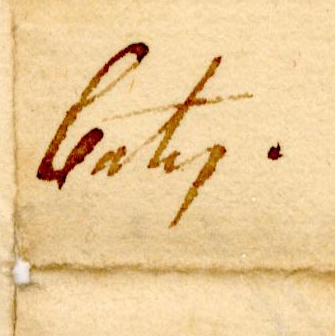Gratz
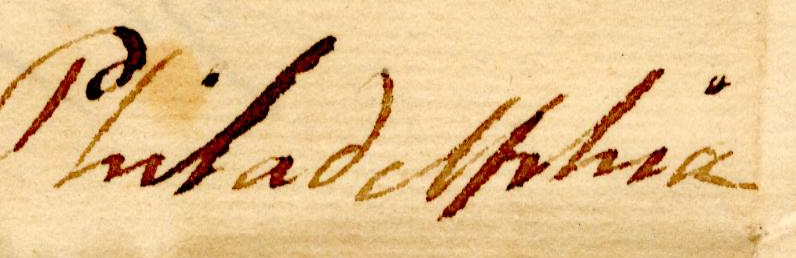Philadelphia
